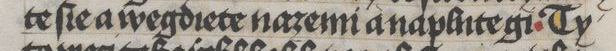te ſie a wegdiete nazemi a naplnte gi.Ty¬
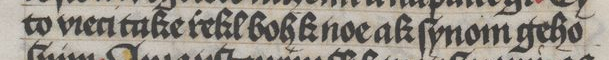to vieci take ṙekl boh k noe ak ſynom geho
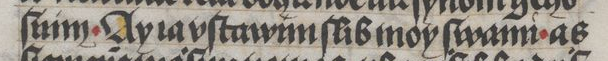ſnim.Ay ia vſtawim ſlib moy ſwamí.a s¬
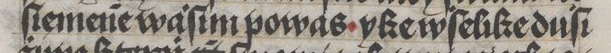ſiemenē waẛim powas.yke wẛelike duẛi
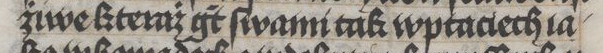żiwe kteraż ḡt ſwami tak wptaciech ia¬
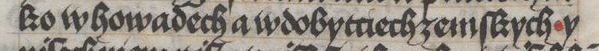ko w howadech a w dobytciech zemſkych.y
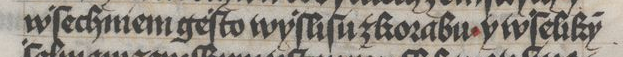wẛechniem geẛto wyẛliſu zkorabu.y wẛelikȳ
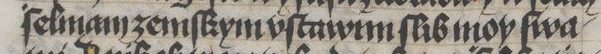ẛelmam zemſkym vſtawim ſlib moy ſwa¬
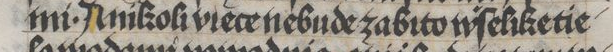mi.A nikoli viece nebude zabito wẛelike tie¬
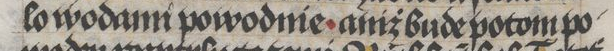lo wodami powodnie.aniż bude potom po¬
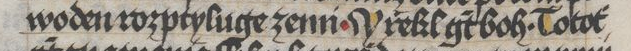woden rozptyluge zemi.Y ṙekl ḡt boh.Totoṫ
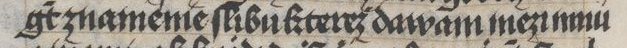ḡt znameníe ſlibu ktereż dawaní mezi mnú
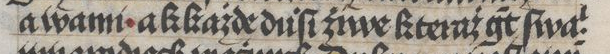a wami.a k każde duẛi żiwe kteraż ḡt ſwāi.
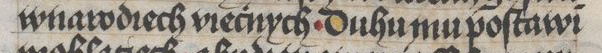wnarodiech vieċnych.Duhu mu poſtawī
